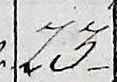23
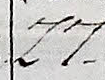27
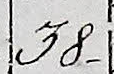38
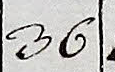36
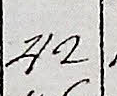42
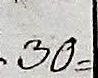30
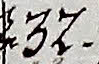32
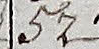52
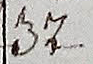32
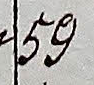59
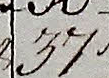37
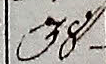38
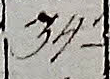34
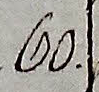60
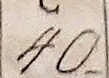40
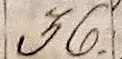36
